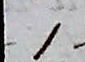1
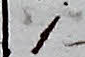1
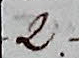2
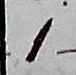1
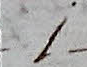1
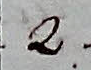2
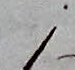1
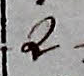2
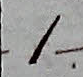1
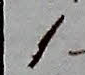1
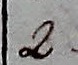2
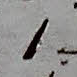1
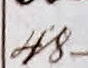48
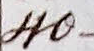40
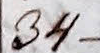34
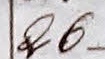26
